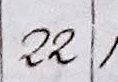22
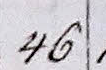46
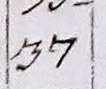37
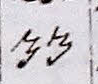33
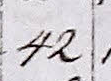42
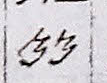33
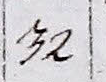32
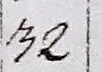32
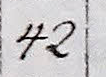42
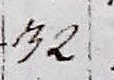32
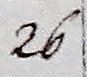26
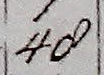48
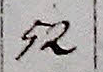52
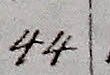44
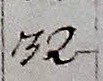32
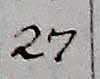27
